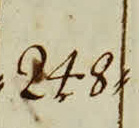248
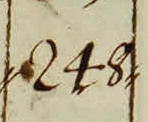248
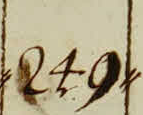249
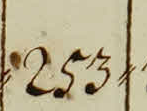253
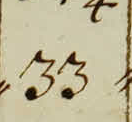33
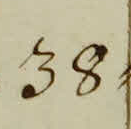38
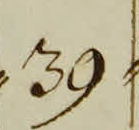39
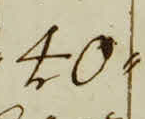40
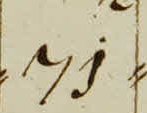71
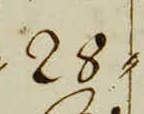28
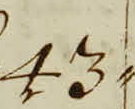43
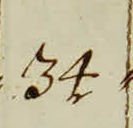34
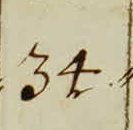34
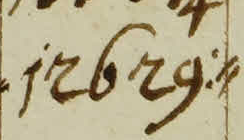12629:
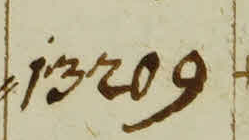13209
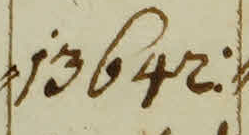13642:
